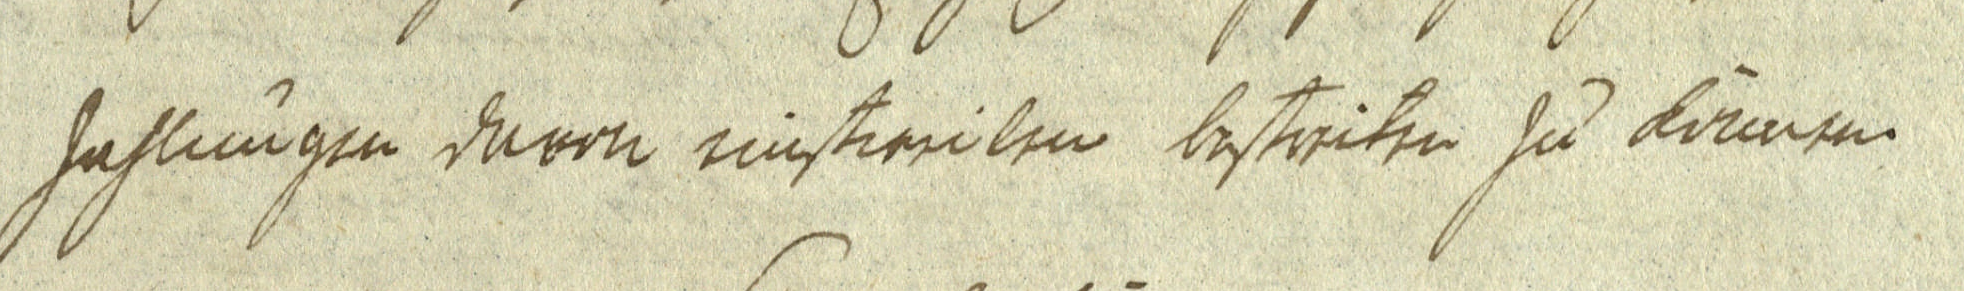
Zahlungen davon einstweilen bestreiten zu können.
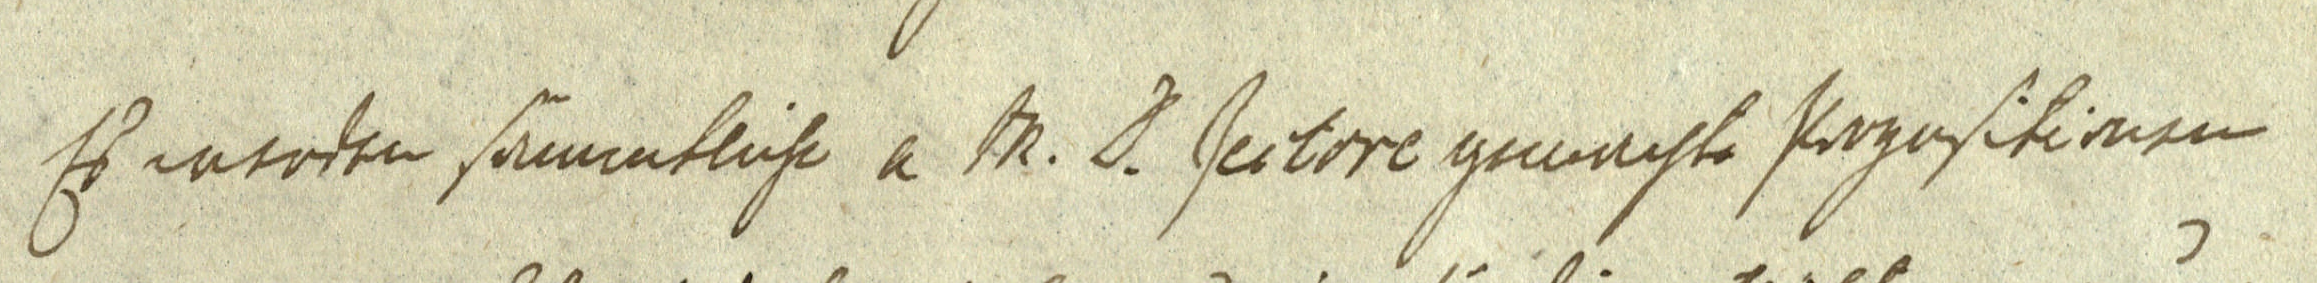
Es werden sämmtliche a M. D. Rectore gemachte Propositionen
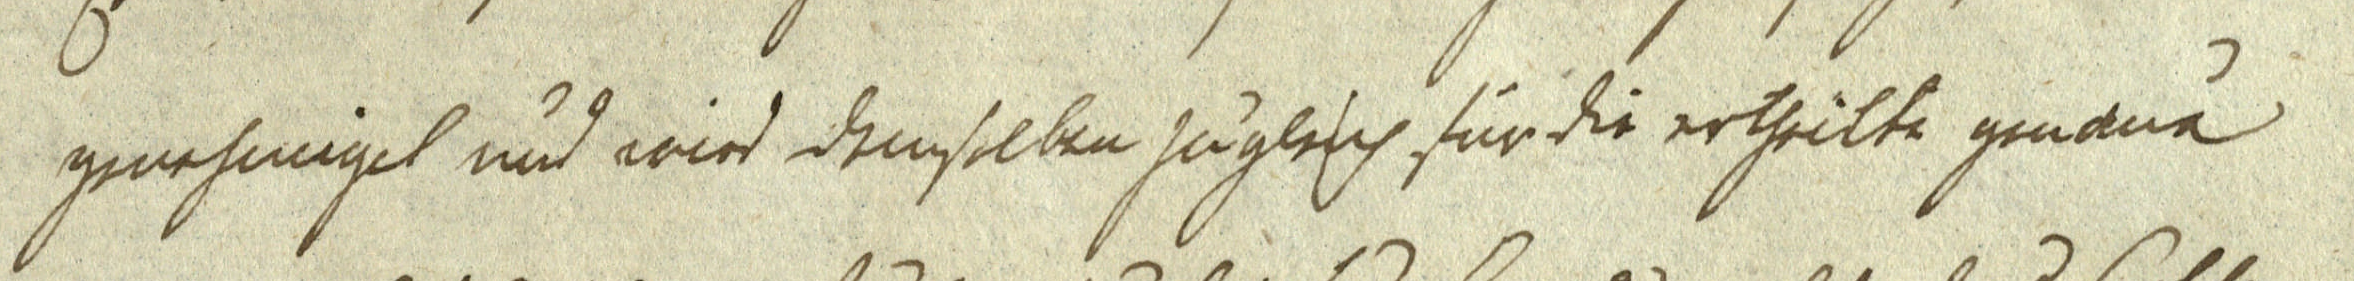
genehmiget und wird denselben zugleich für die ertheilte genaue
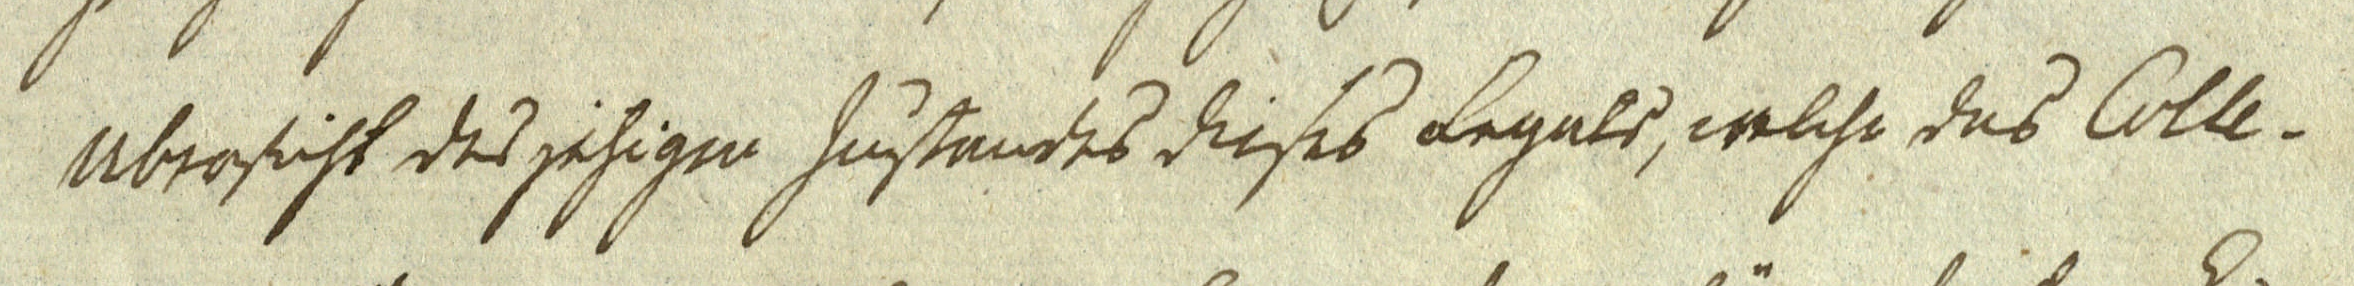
Übersicht des jetzigen Zustandes dieses Legats, welche das Colle¬
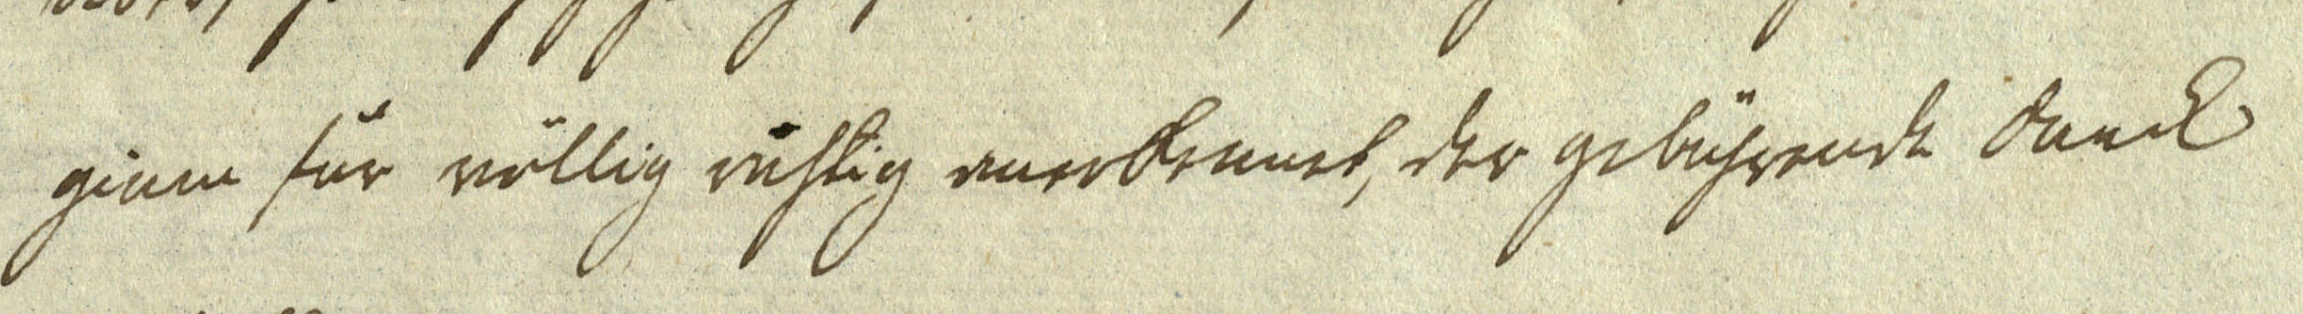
gium für völlig richtig anerkennet, der gebührende Danck
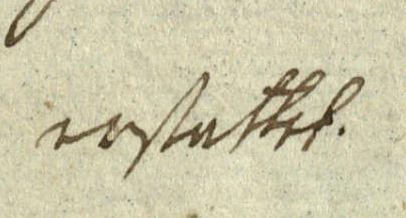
erstattet.
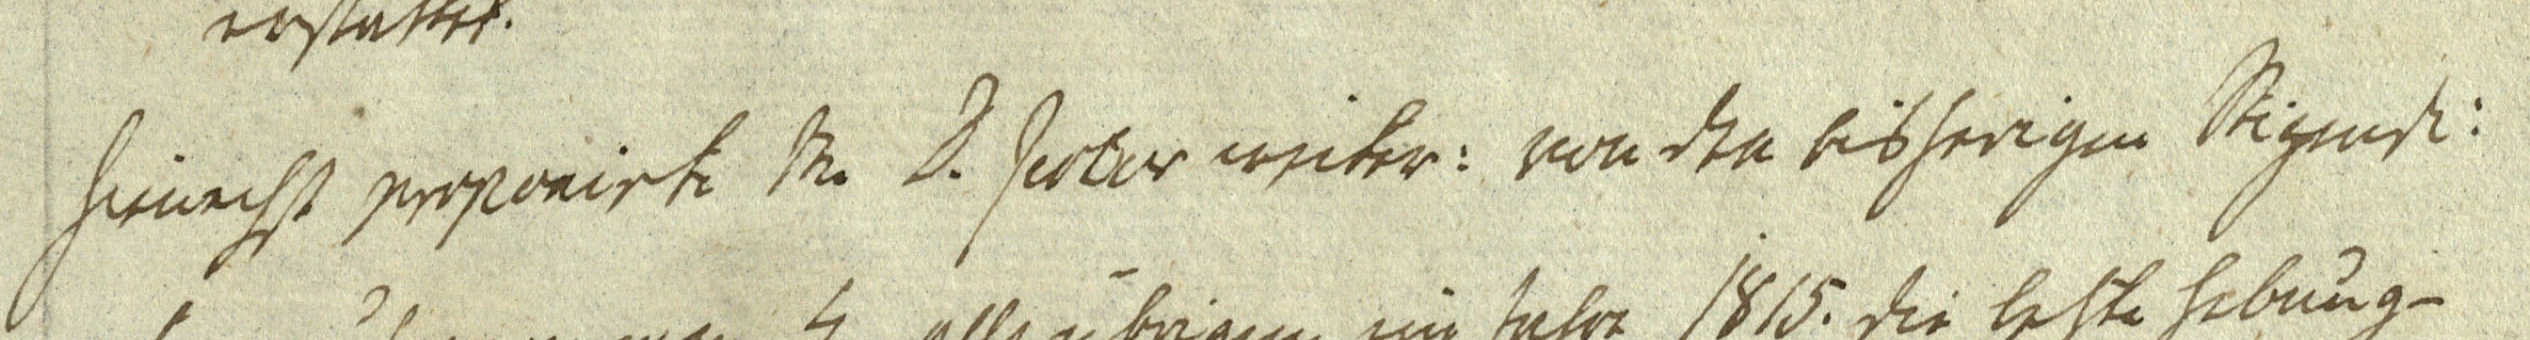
Hienechst proponirte M. D. Rector weiter: von den bisherigen Stipendi¬
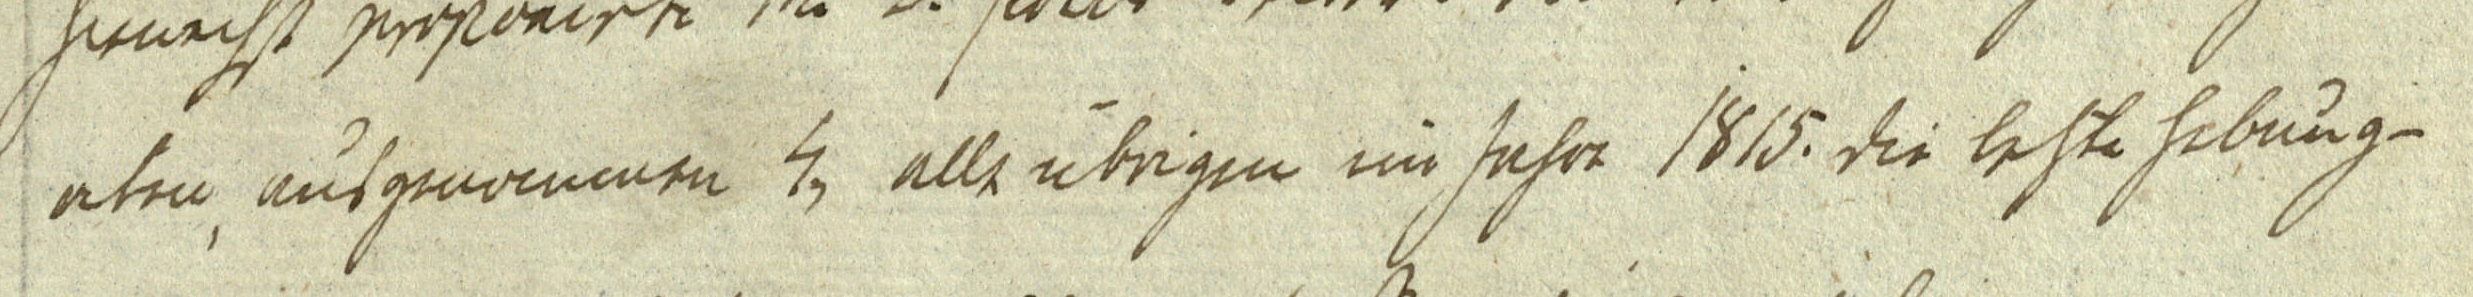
aten, ausgenommen 4., alle übrigen in Jahre 1815. die letzte Hebung
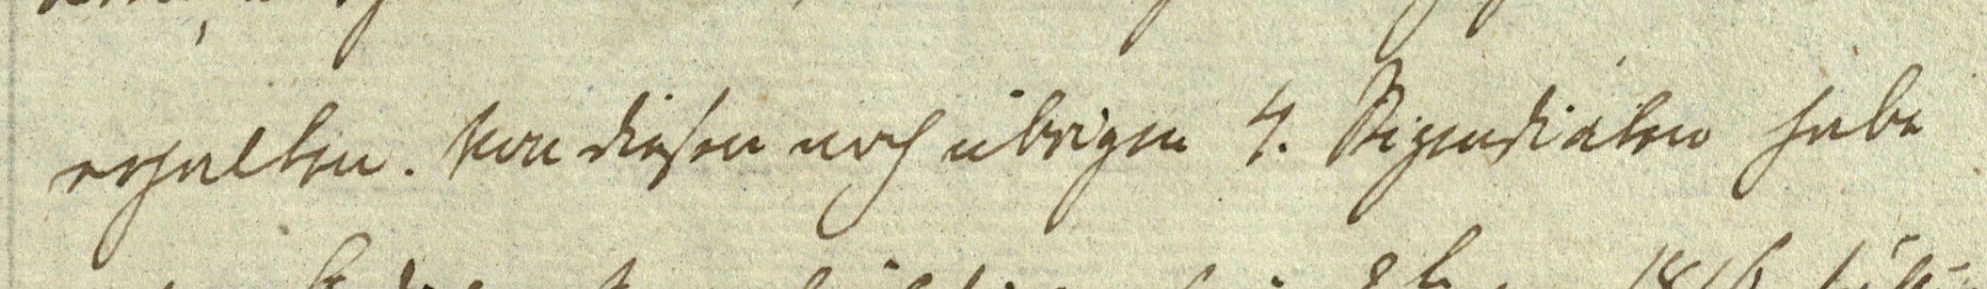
erhalten. von diesen noch übrigen 4. Stipendiaten habe
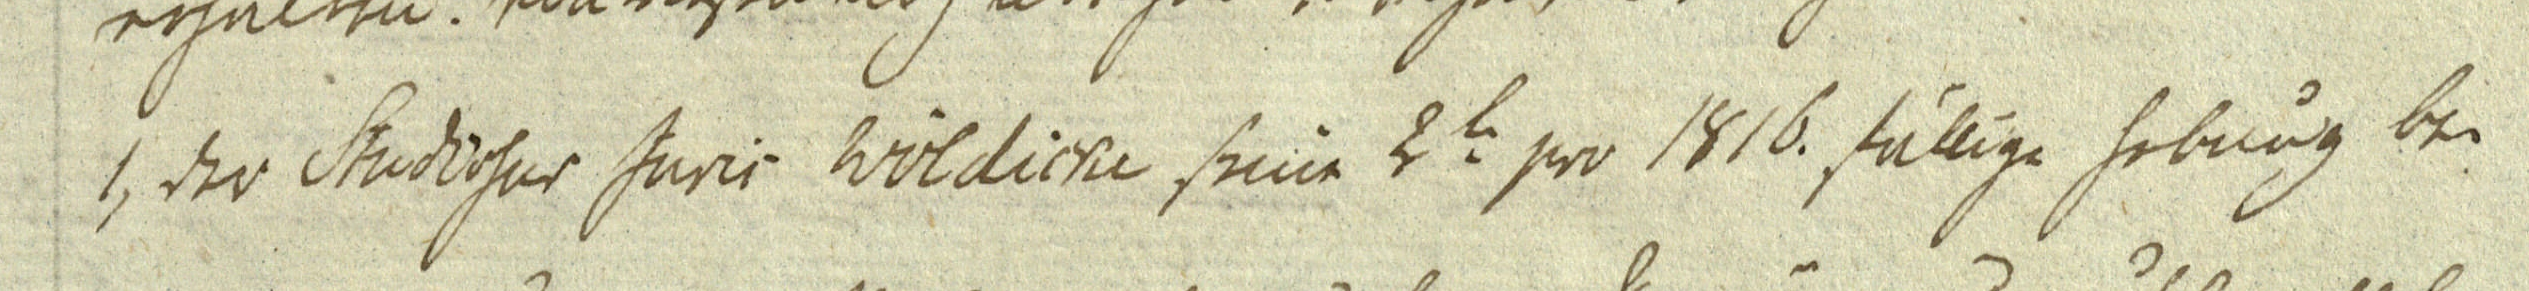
1, der Studiosus Juris Wöldicke seine 2 te pro 1816. fällige Hebung be¬
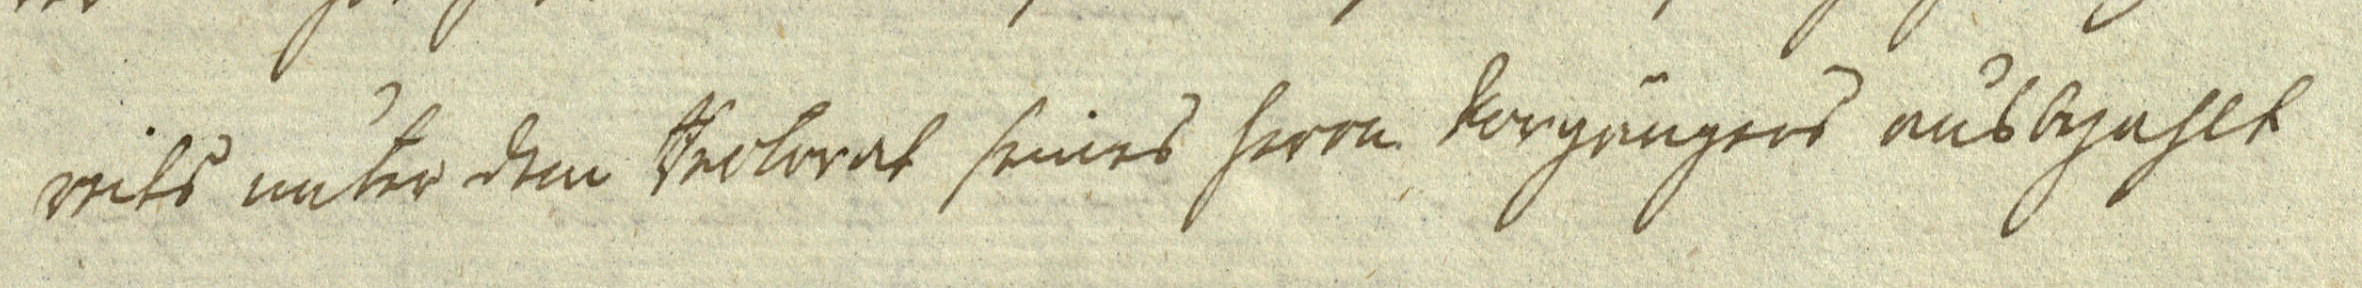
reits unter dem Rectorat seines Herrn Vorgängers ausbezahlt
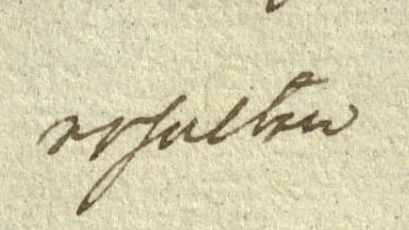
erhalten
